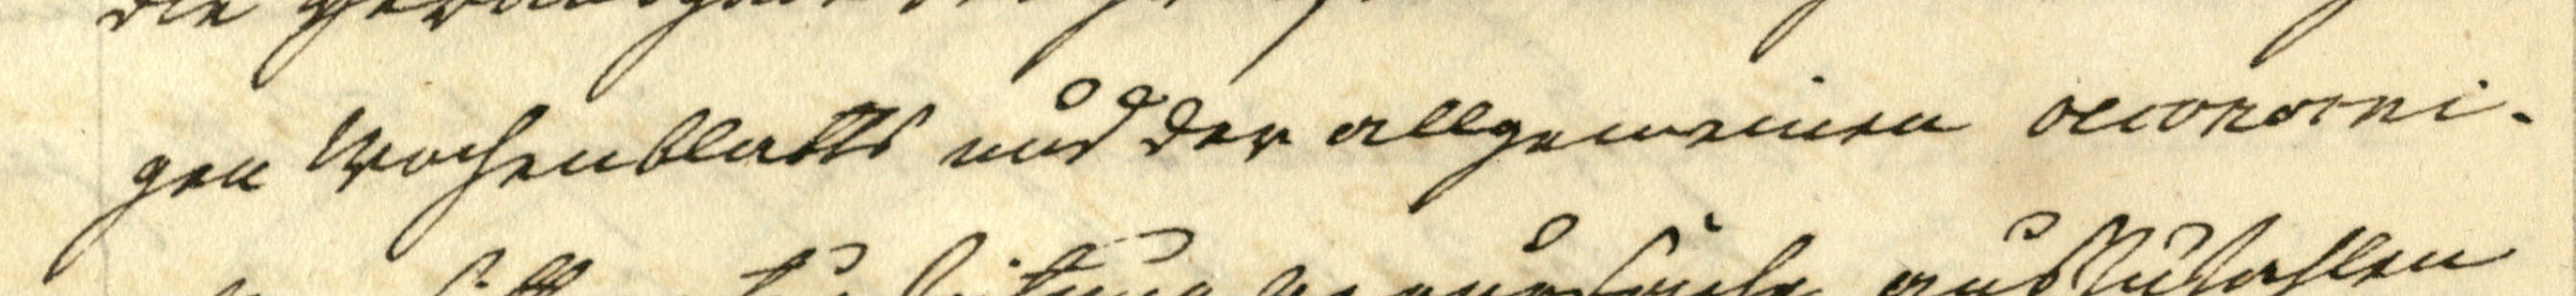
gen Wochenblatts und der allgemeinen oeconomi¬
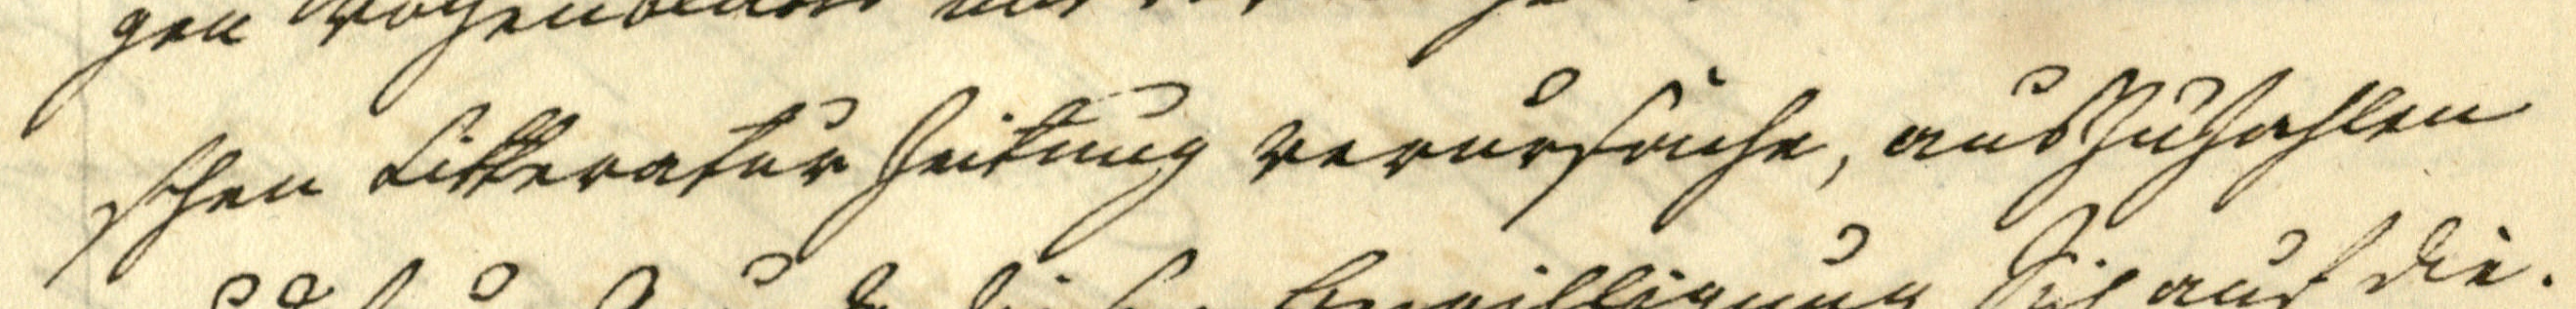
schen Litteratur Zeitung verursache, auszuzahlen
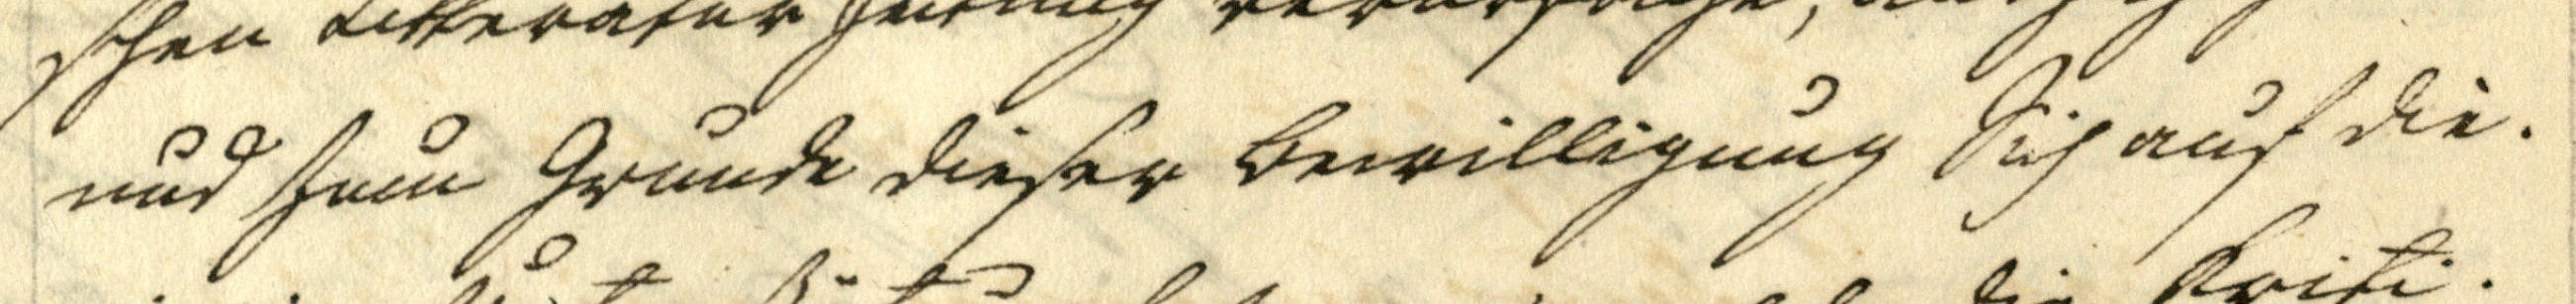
und zum Grunde dieser Bewilligung Sich auf die¬
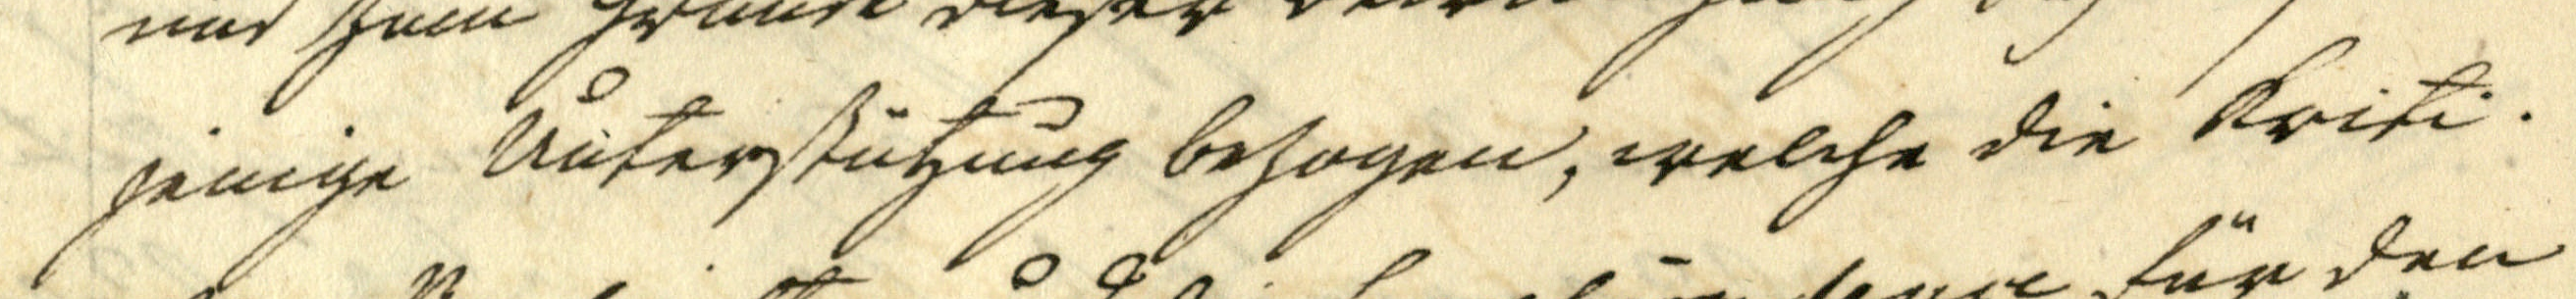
jenige Unterstützung bezogen, welche die Kriti¬
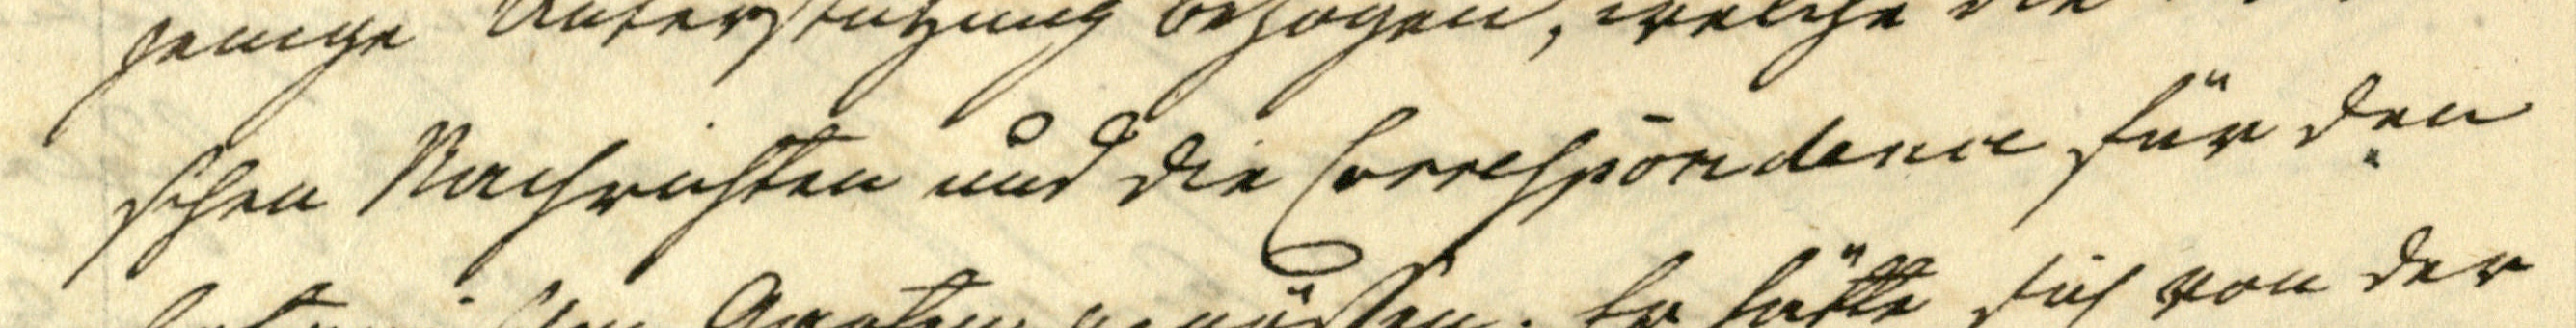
schen Nachrichten und die Correspondence für den
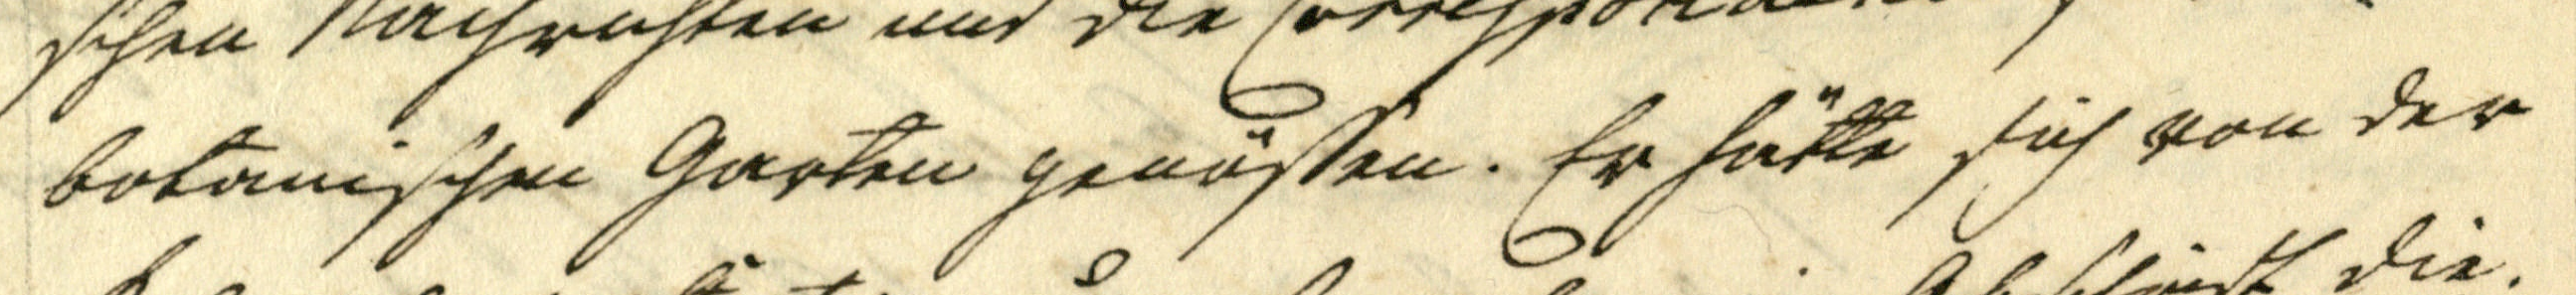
botanischen Garten genössen. Er hätte sich von der
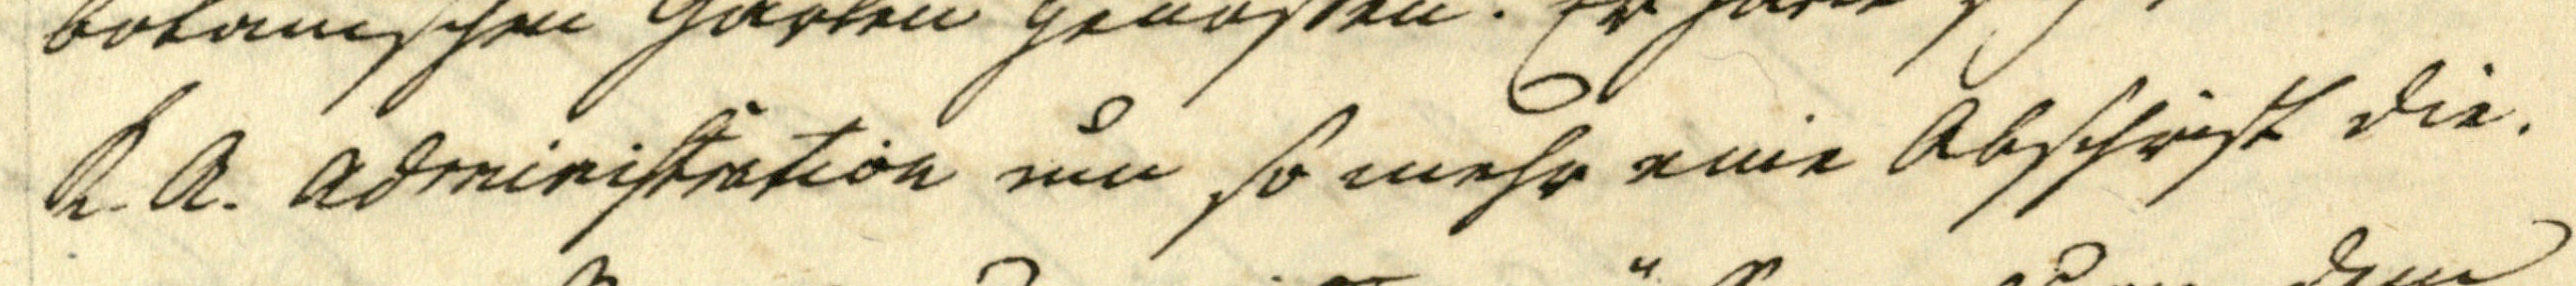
K. A. Administration um so mehr eine Abschrift die¬
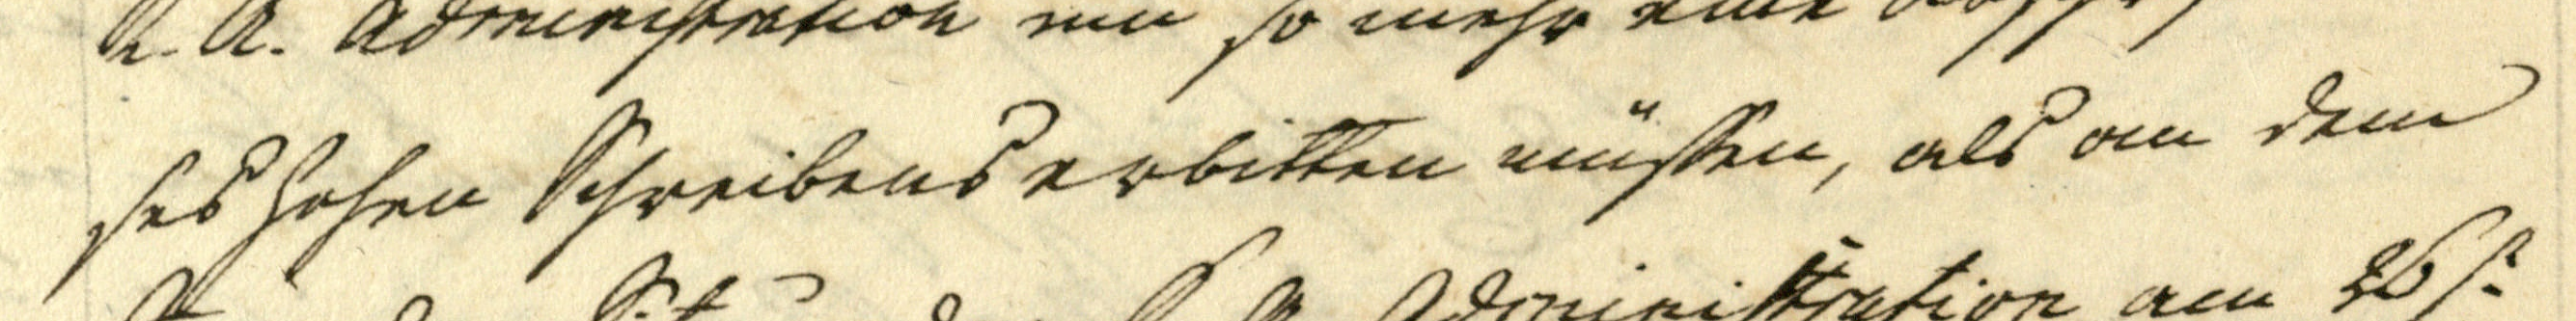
ses hohen Schreibens erbitten müssen, als an dem
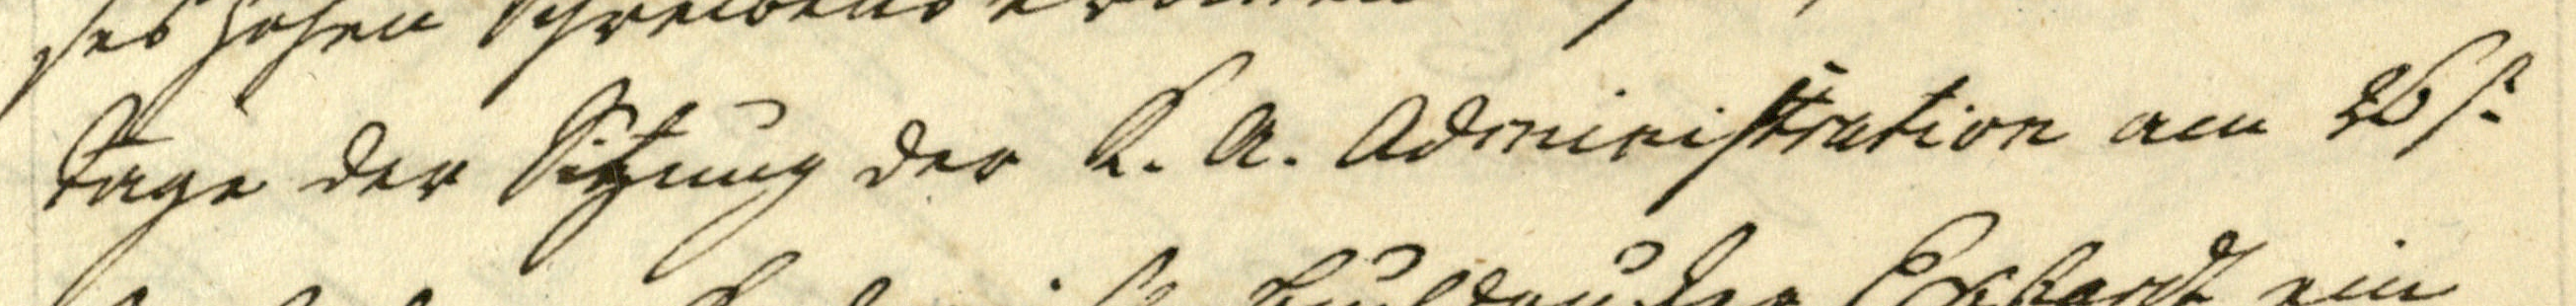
Tage der Sitzung der K. A. Administration am 26 t.
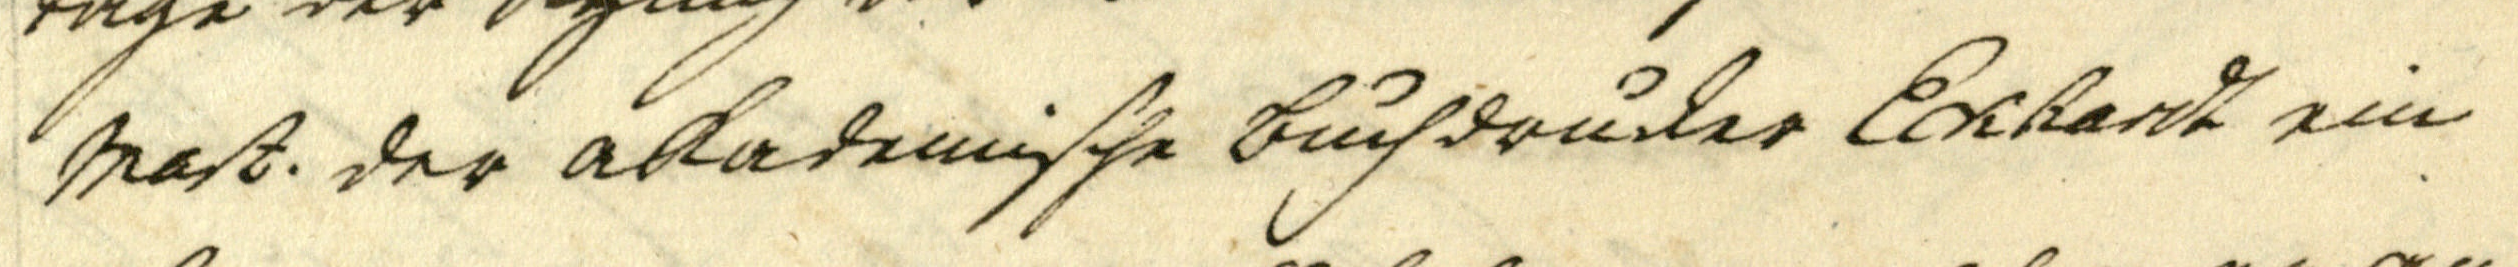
Mart. der akademische Buchdrucker Eckhardt ein
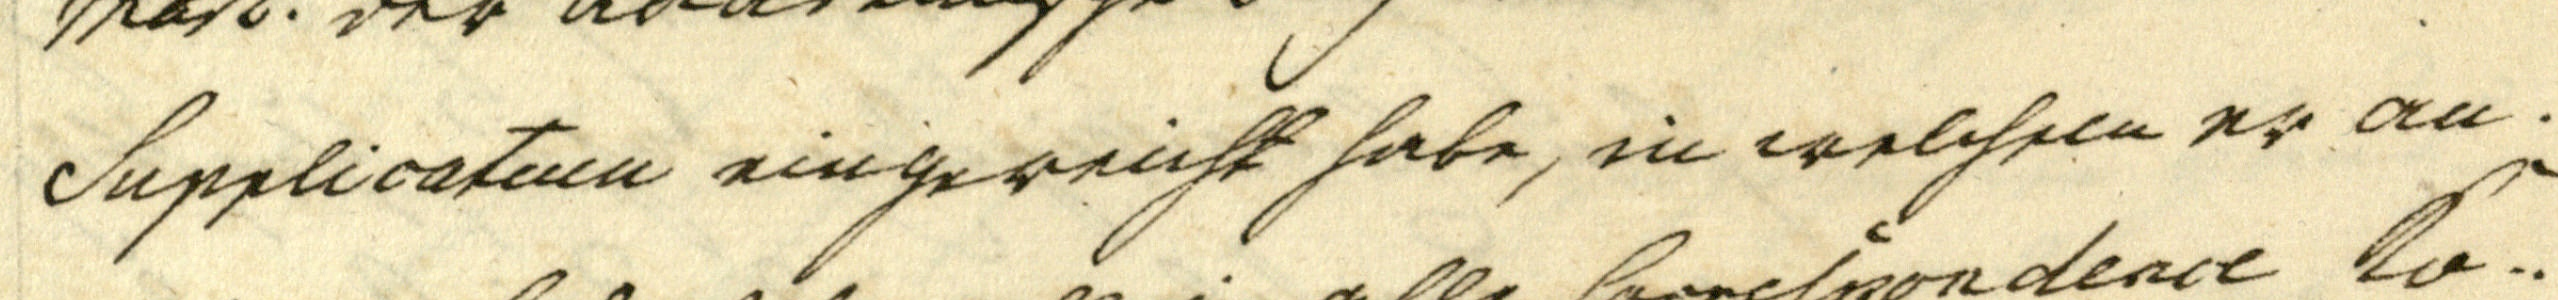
Supplicatum eingereicht habe, in welchem er an¬
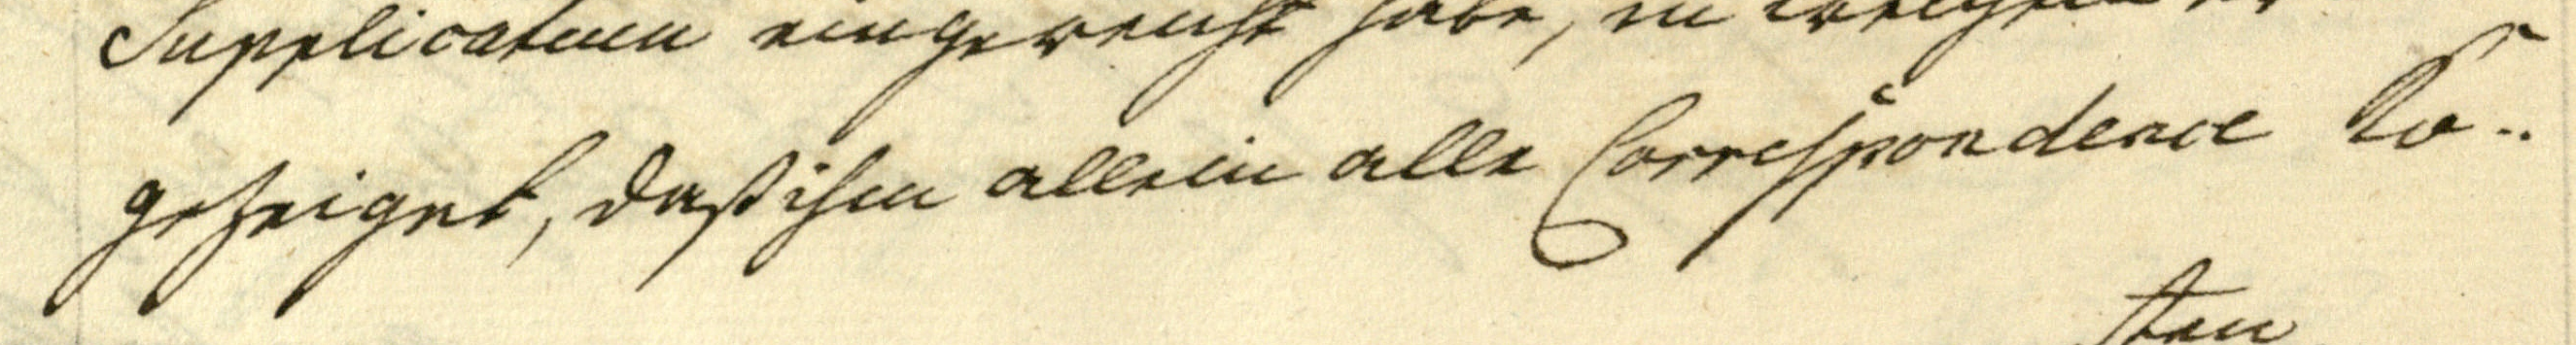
gezeiget, daß ihm allein alle Correspondence Ko¬
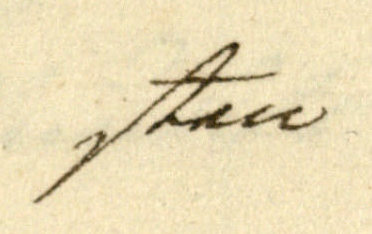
sten
